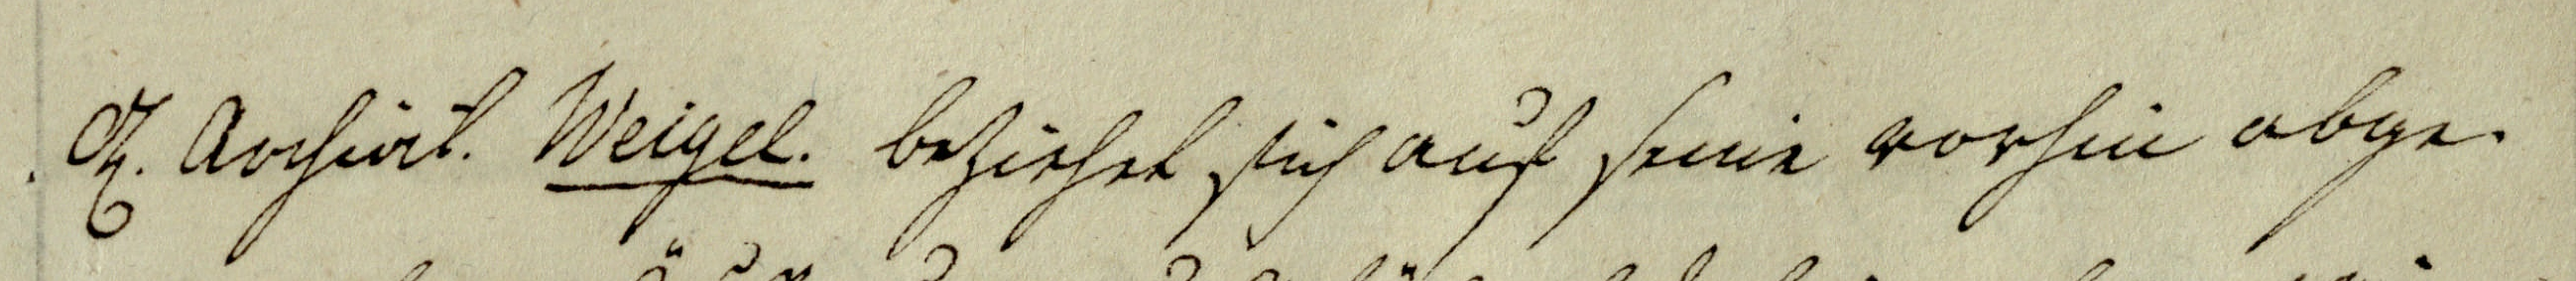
dh. Archiat. Weigel. beziehet sich auf seine vorhin abge¬
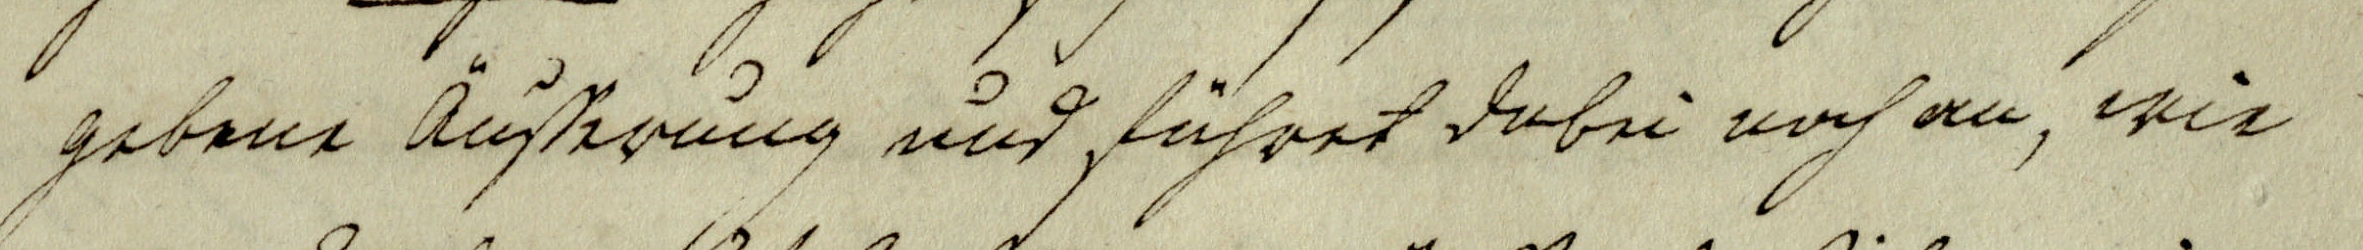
gebene Äusserung und führet dabei noch an, wie
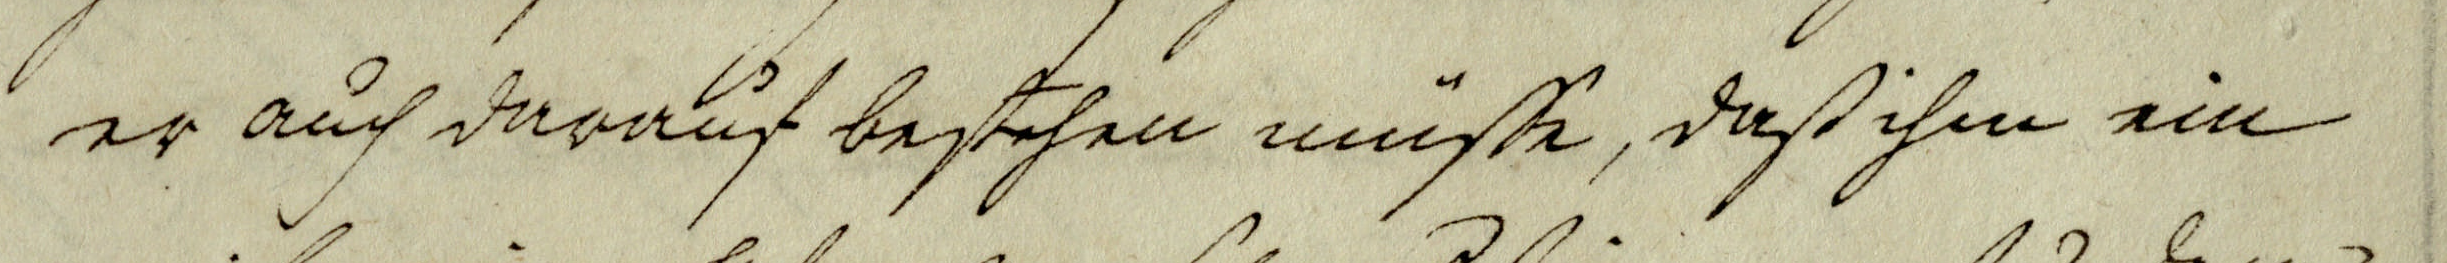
er auch darauf bestehen müsse, daß ihm ein
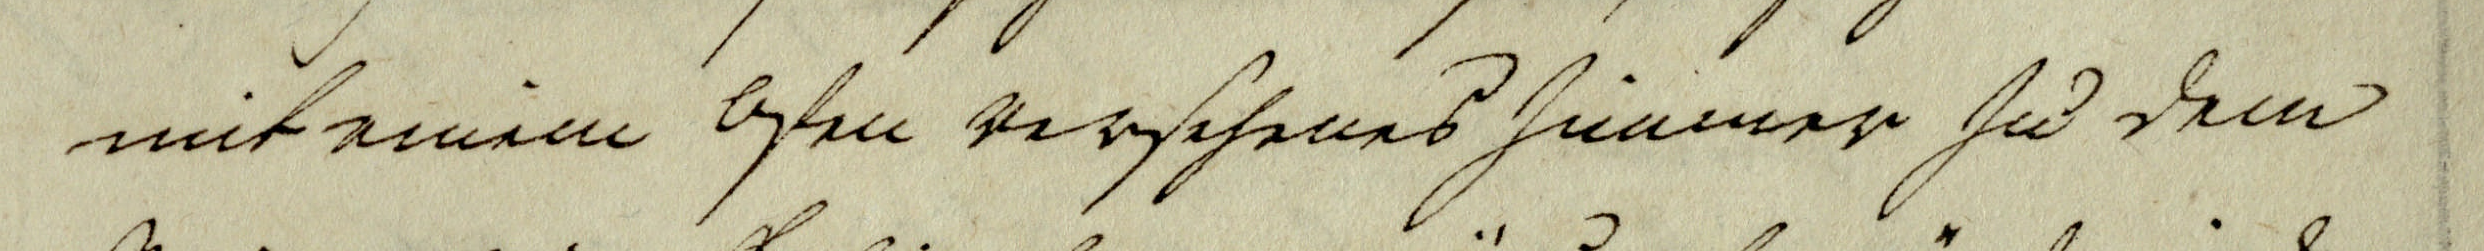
mit einem Ofen versehenes Zimmer zu dem
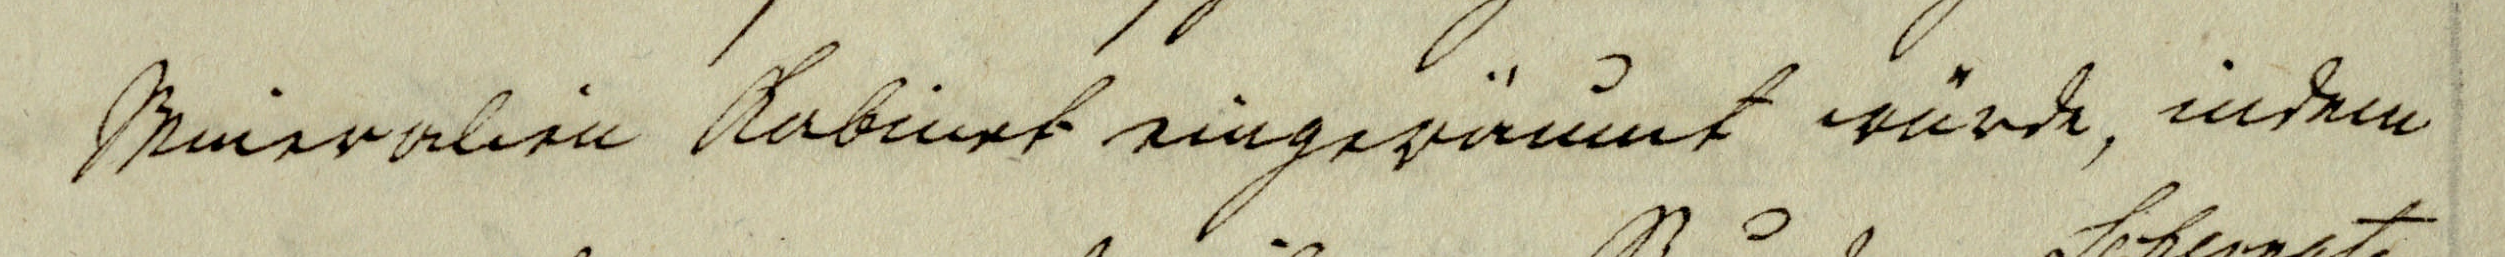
Mineralien Cabinet eingeräumt würde, zu dem
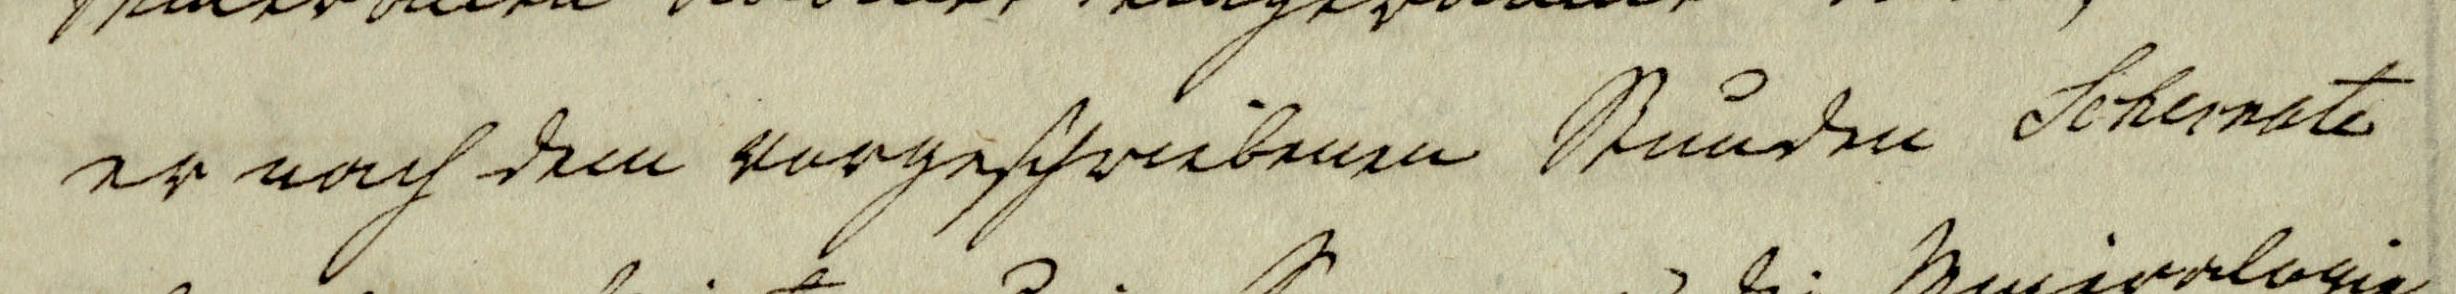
er nach dem vorgeschriebenen Stunden Schemate
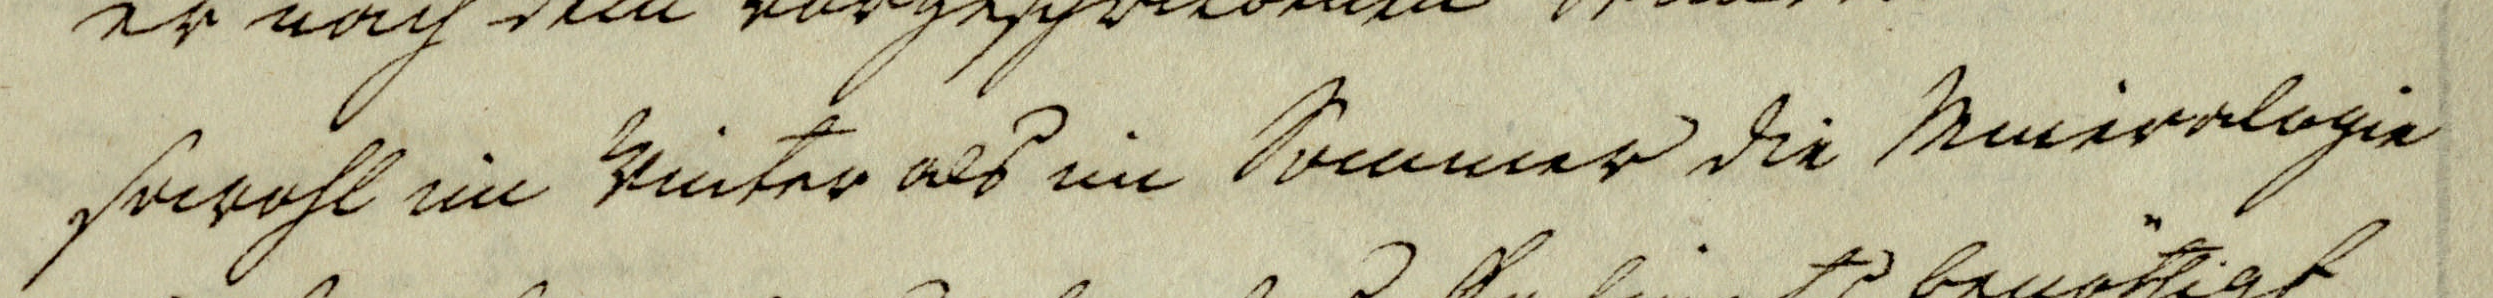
sowohl im Winter als im Sommer die Mineralogie
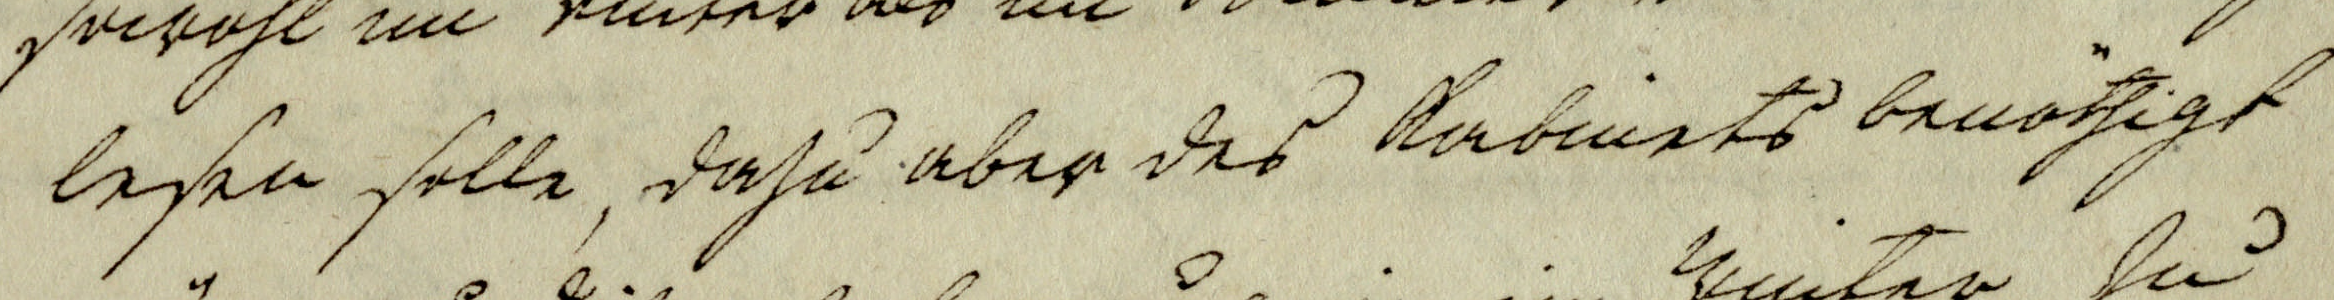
lesen solle, dazu aber des Kabinets benöthigt
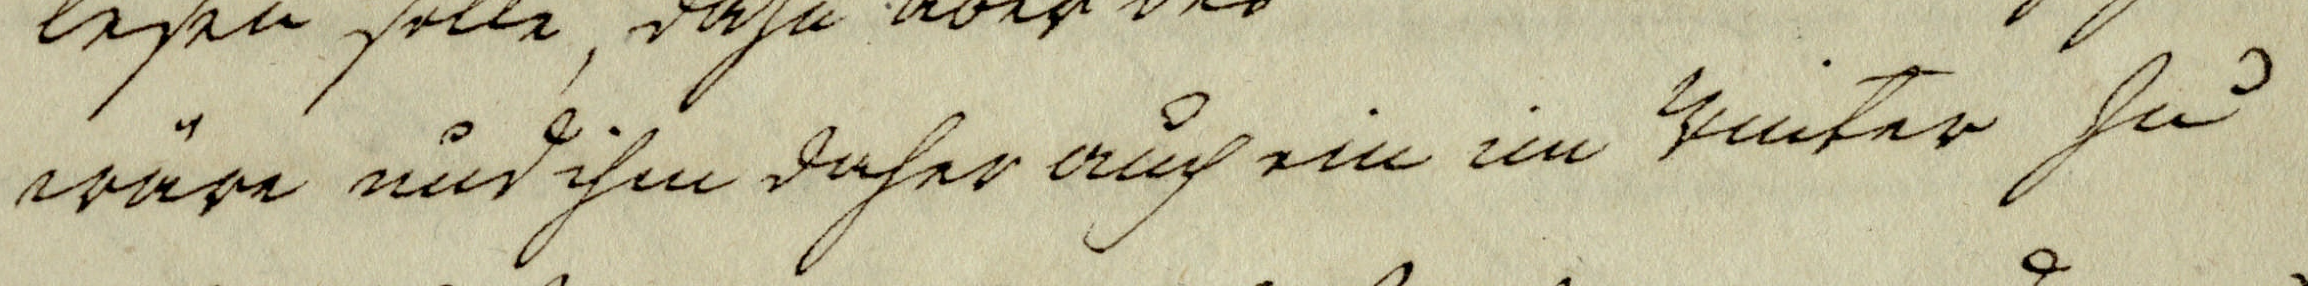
wäre und ihm daher auch ein im Winter zu
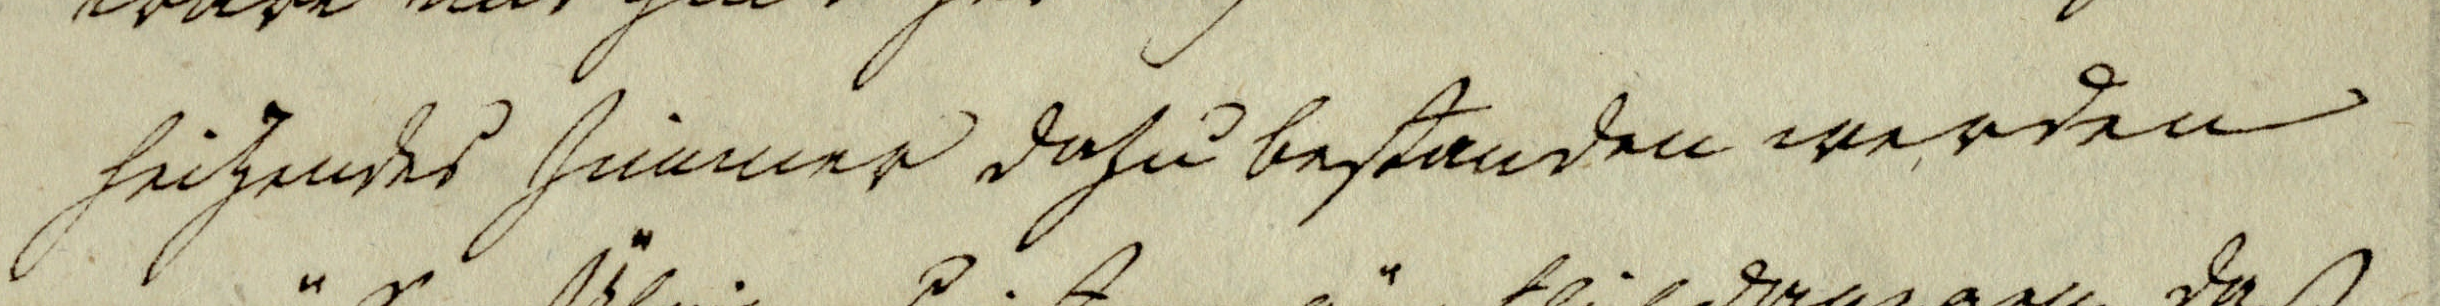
heizendes Zimmer dazu bestanden werden
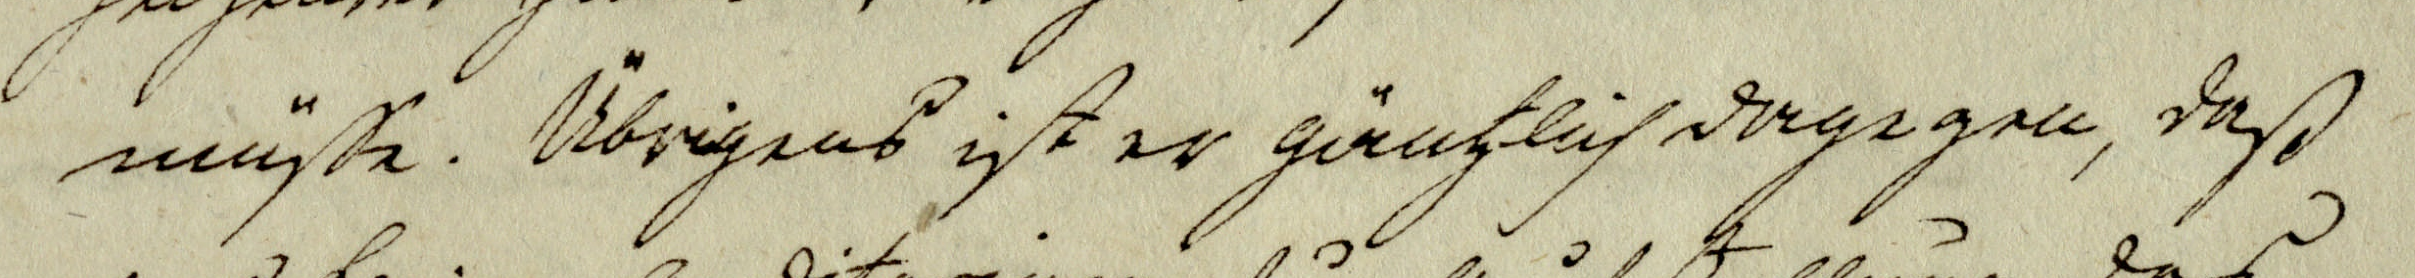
müsse. Übrigens ist er gäntzlich dagegen, daß
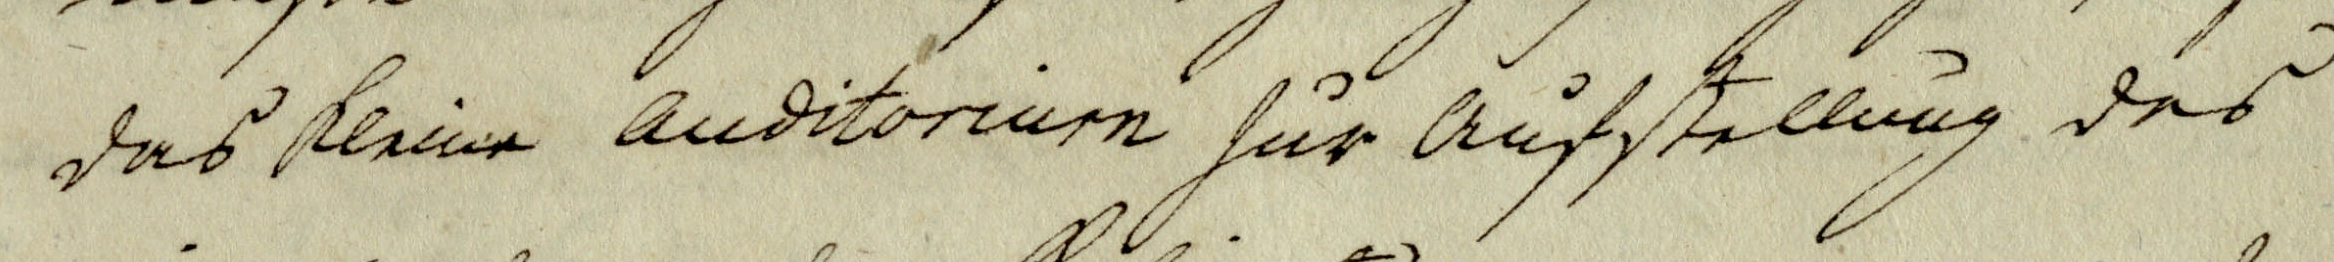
das kleine Auditorium zur Aufstellung des
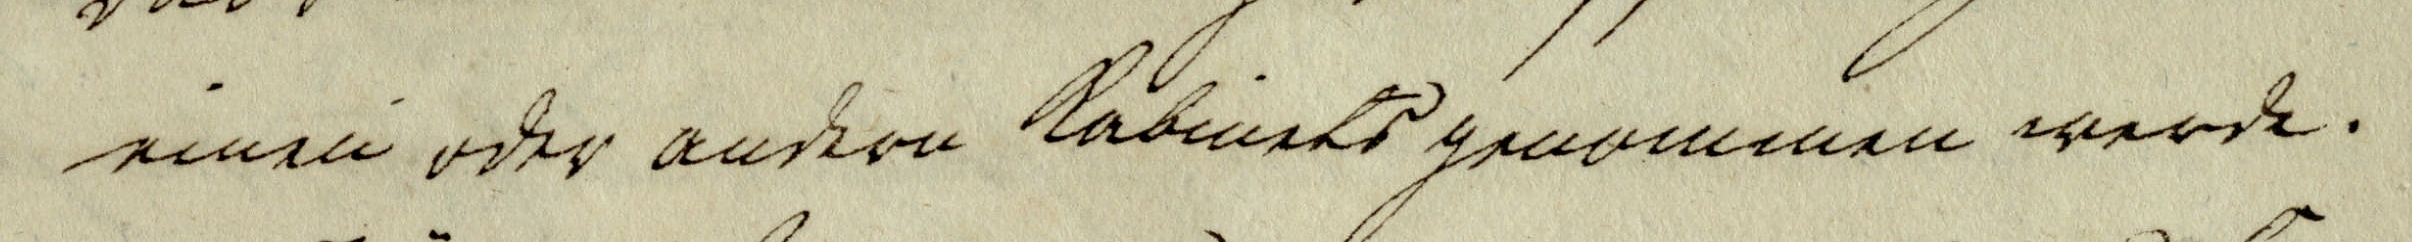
einen oder andern Kabinets genommen werde.
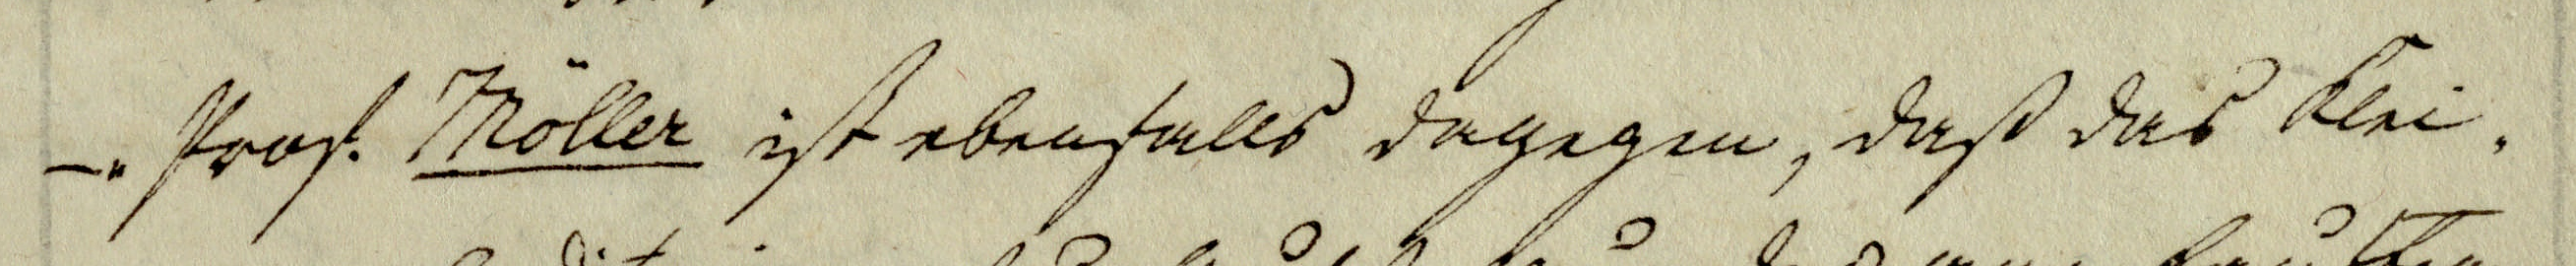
Prof. Möller ist ebenfalls dagegen, daß das klei¬
